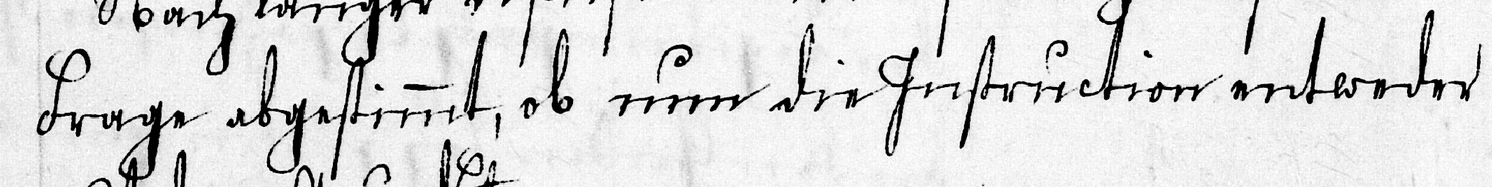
Frage abgestimmt, ob nun die Instruction entweder
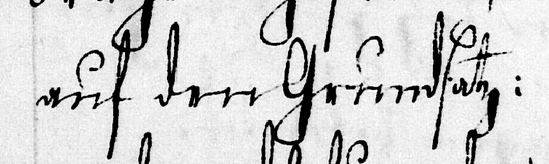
auf den Grundsatz:
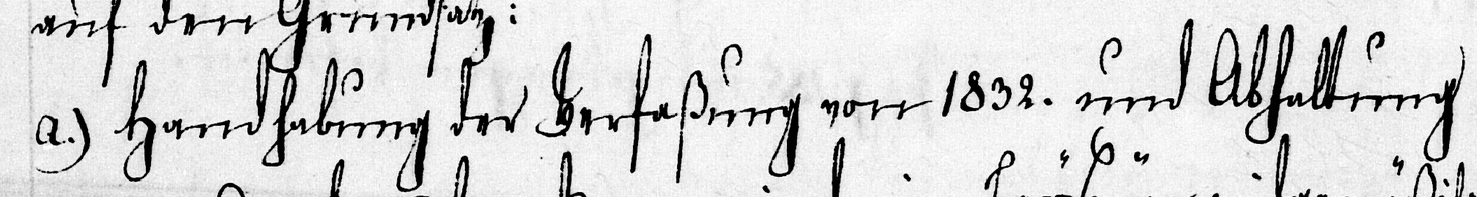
a.) Handhabung der Verfaßung von 1832. und Abhaltung
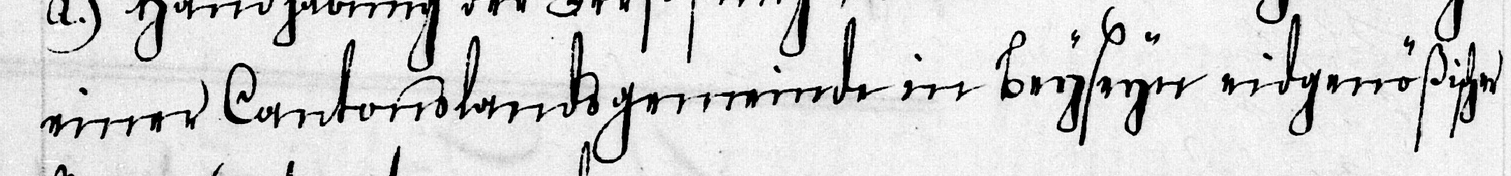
einer Cantonslandsgemeinde in Beysein eidgenößisch¬
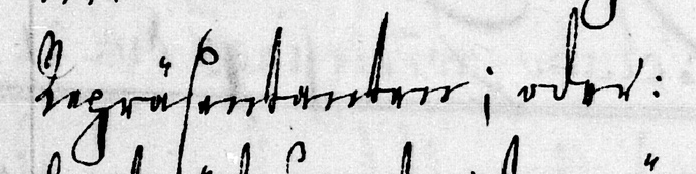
Repräsentanten; oder:
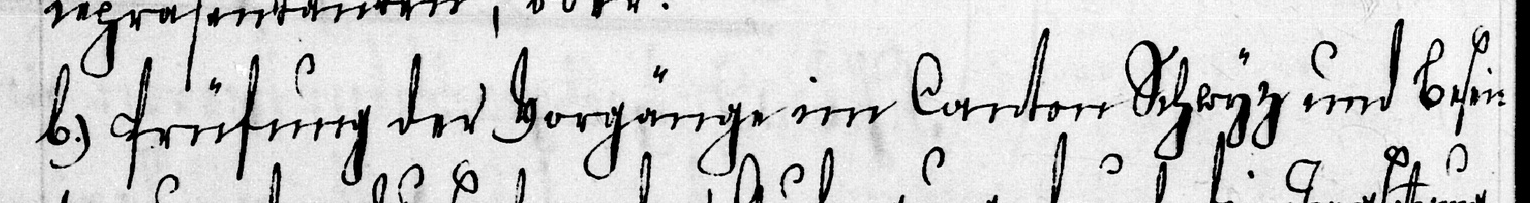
b.) Prüfung der Vorgänge im Canton Schwyz und Bese¬
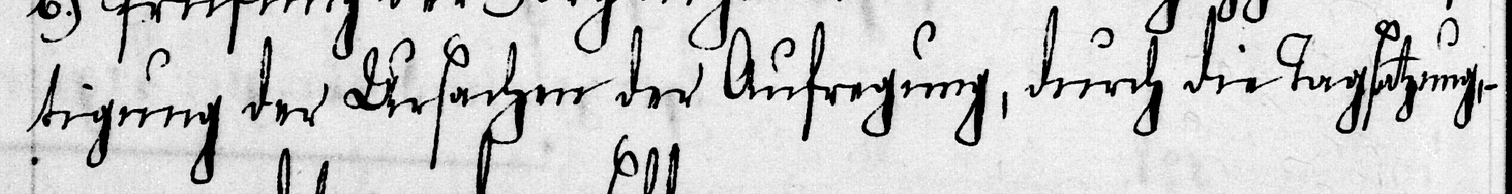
itigung der Ursachen der Aufregung, durch die Tagsatzung,
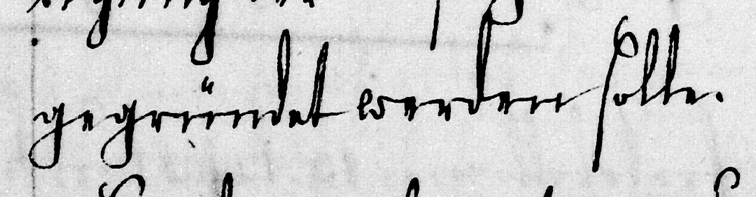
gegründet werden soll¬
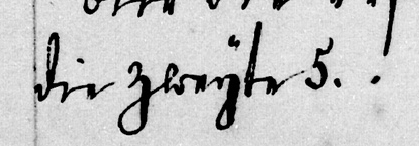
die zweyte 5.
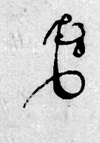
e.
